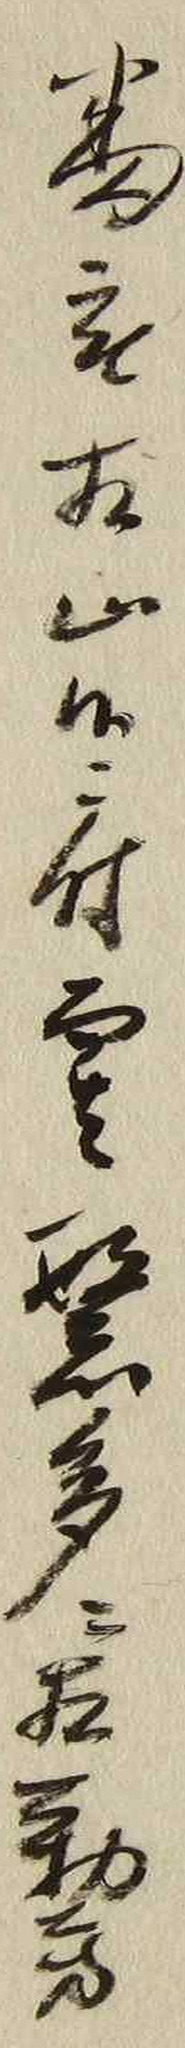番被相止候ニ付而は繁多ニ相勤旁
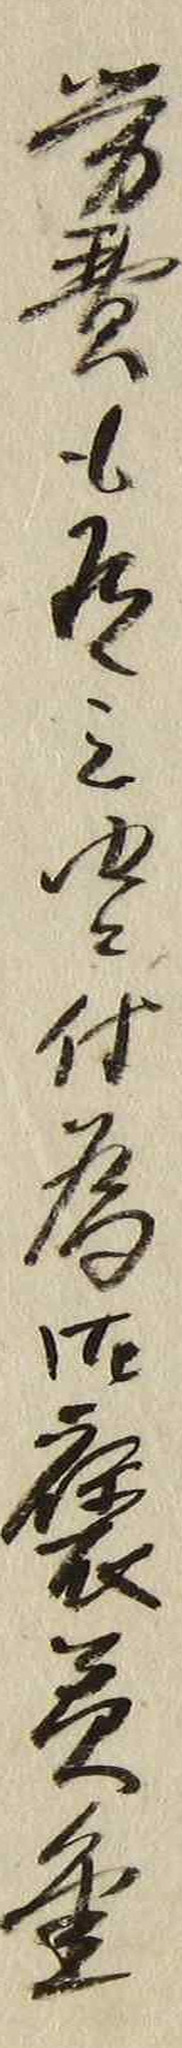労費も有之由ニ付為御褒美金
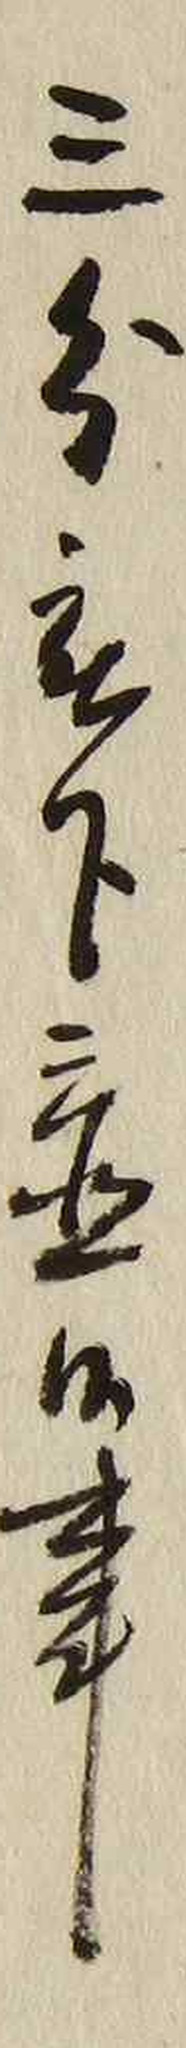三分被下置候事
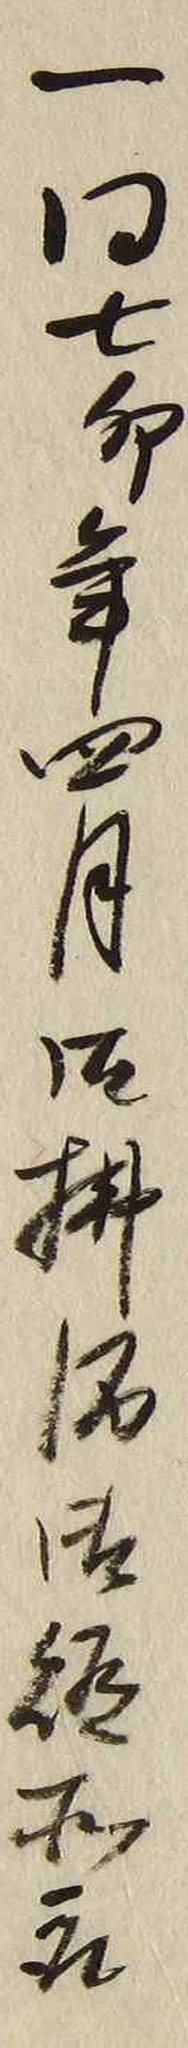一同七卯年四月御払酒御賄所取

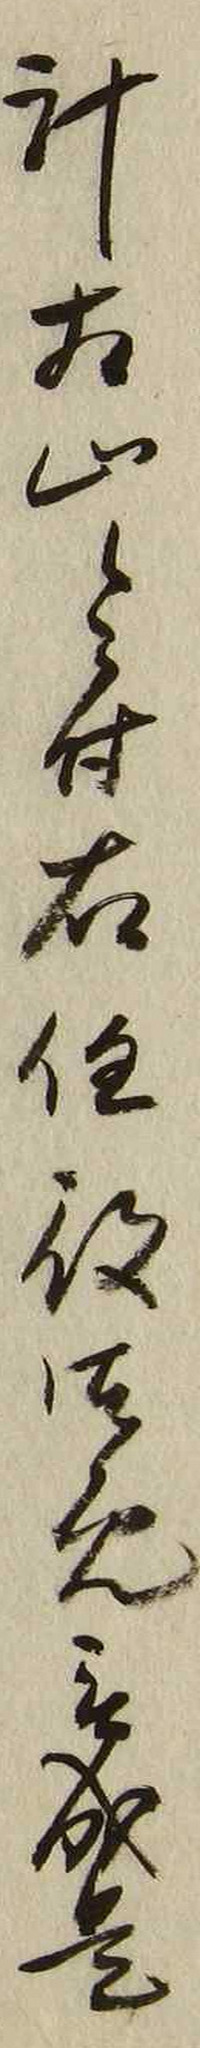計相止候ニ付右任役御免被成是
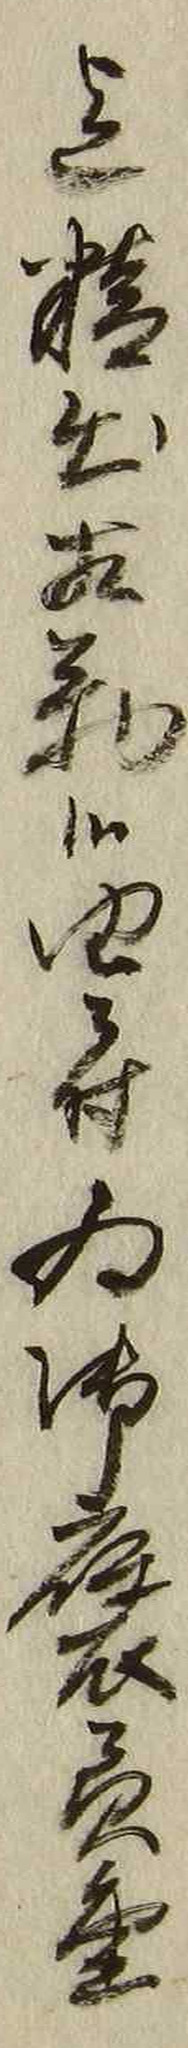迄精出相勤候由ニ付為御褒美金
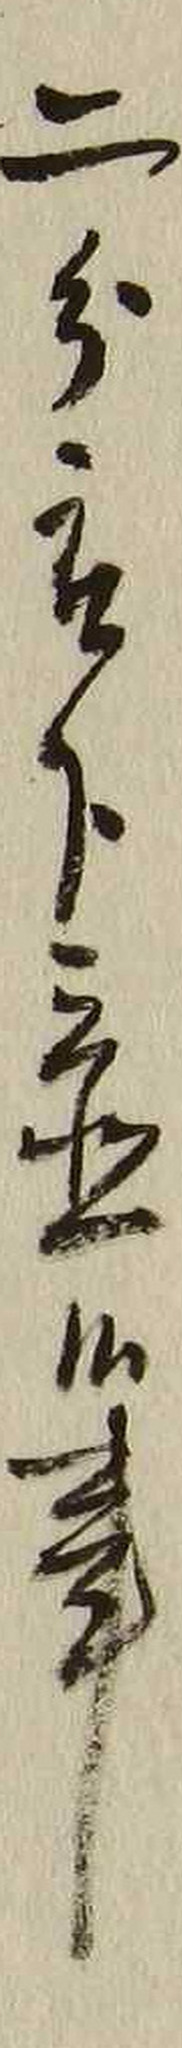二分被下置候事
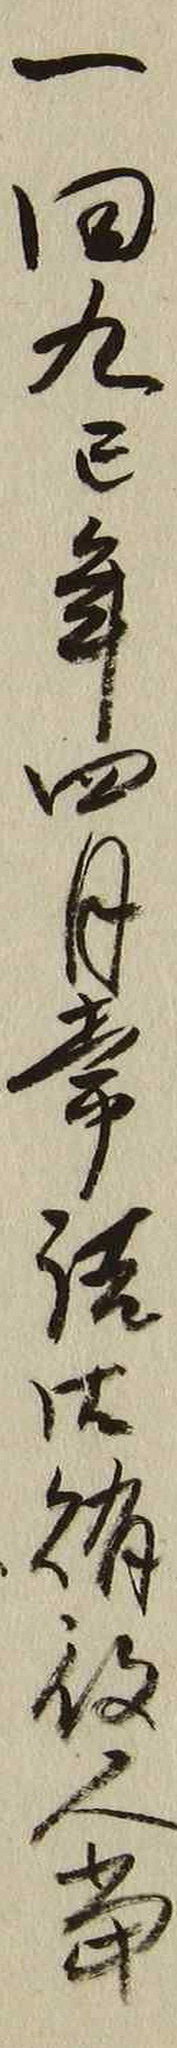一同九巳年四月常詰御賄役人当
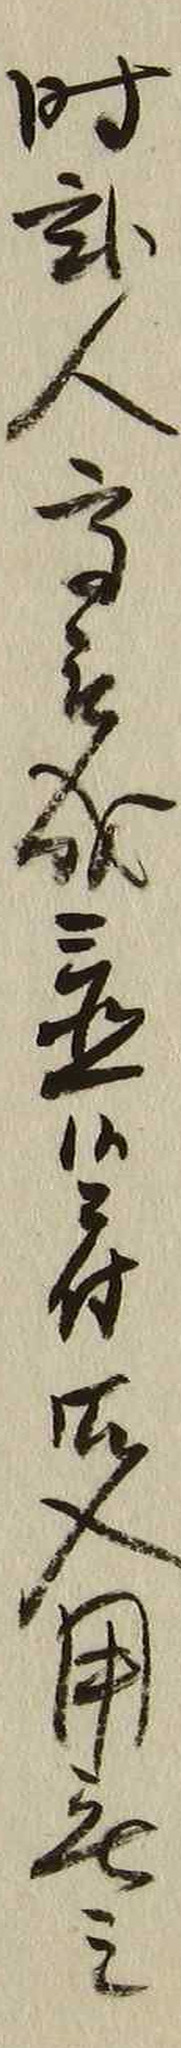時弐人高被成置候ニ付御入用無之
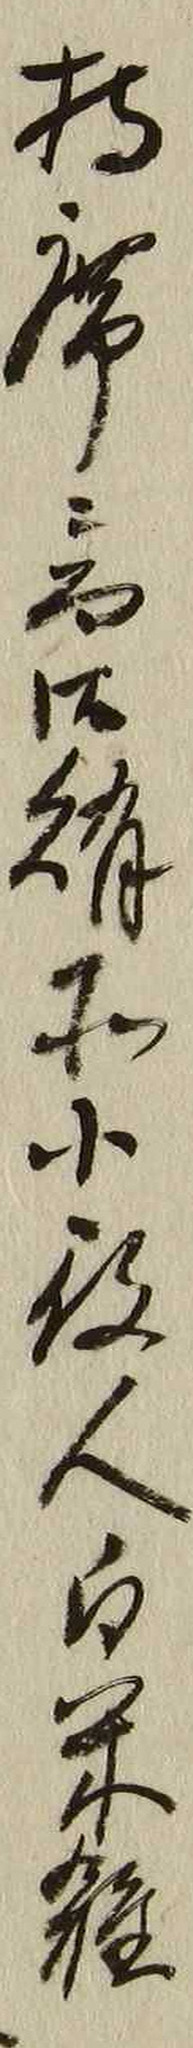持席ニ而御賄所小役人白米雑
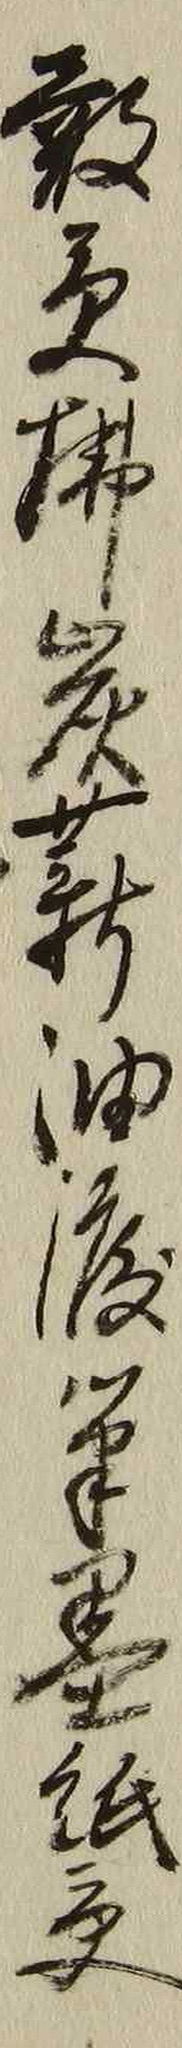穀受払炭薪油渡筆墨紙受
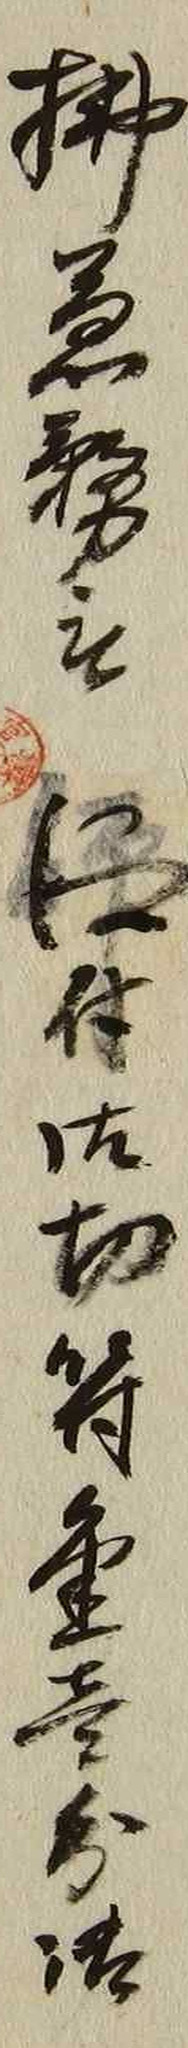払兼務被仰付御切符金壱分御
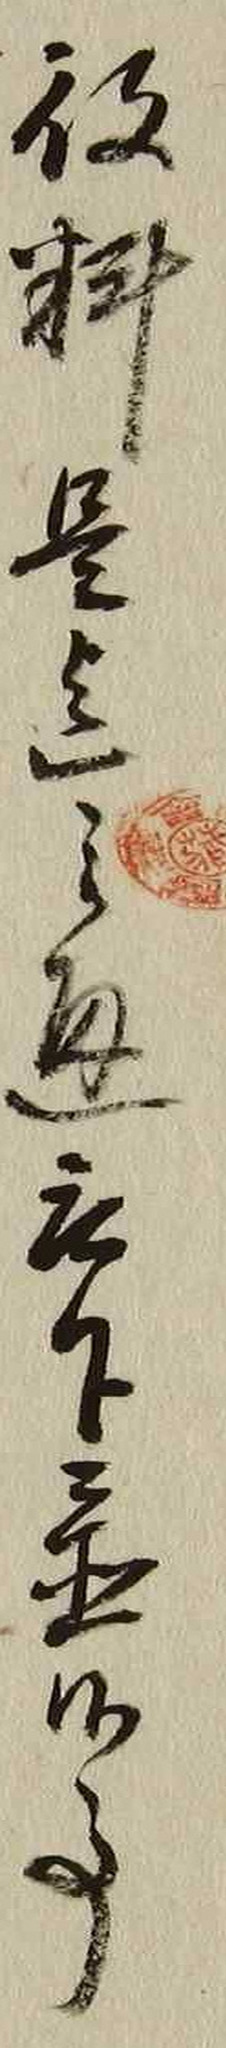役料是迄之通被下置候事
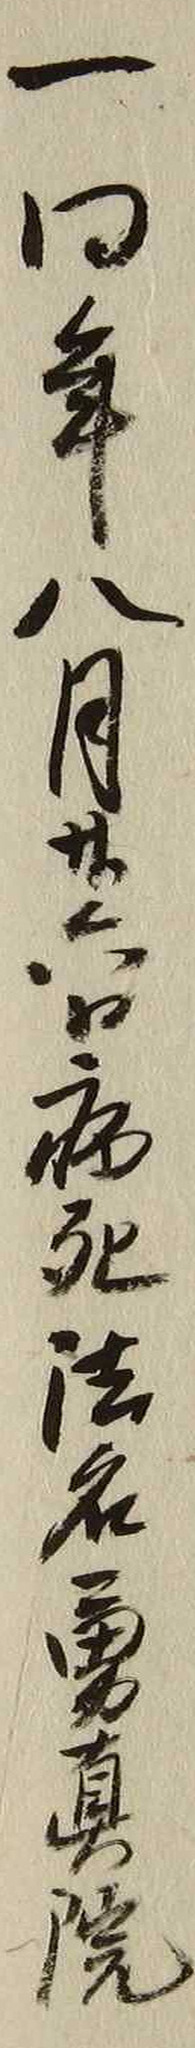一同年八月廿六日病死法名勇真院
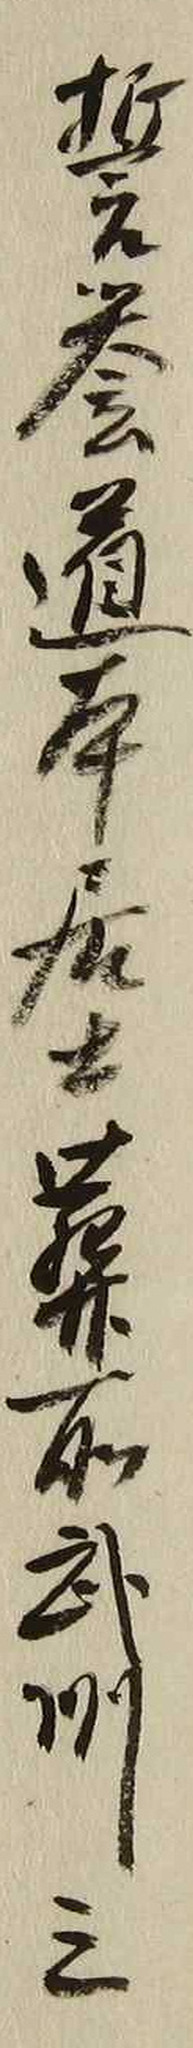誓誉道本居士葬所武州三
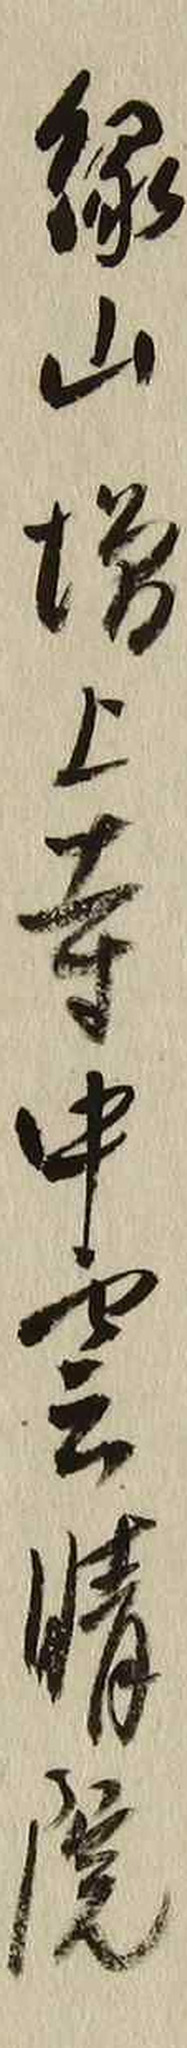縁山増上寺中雲晴院
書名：諸士系譜　巻之353　す之部3
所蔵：会津若松市立会津図書館
